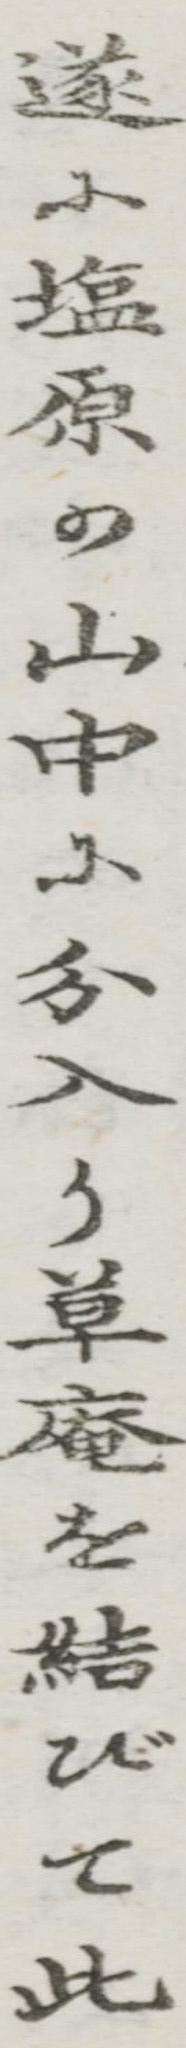遂に塩原の山中に分入り草庵を結びて此
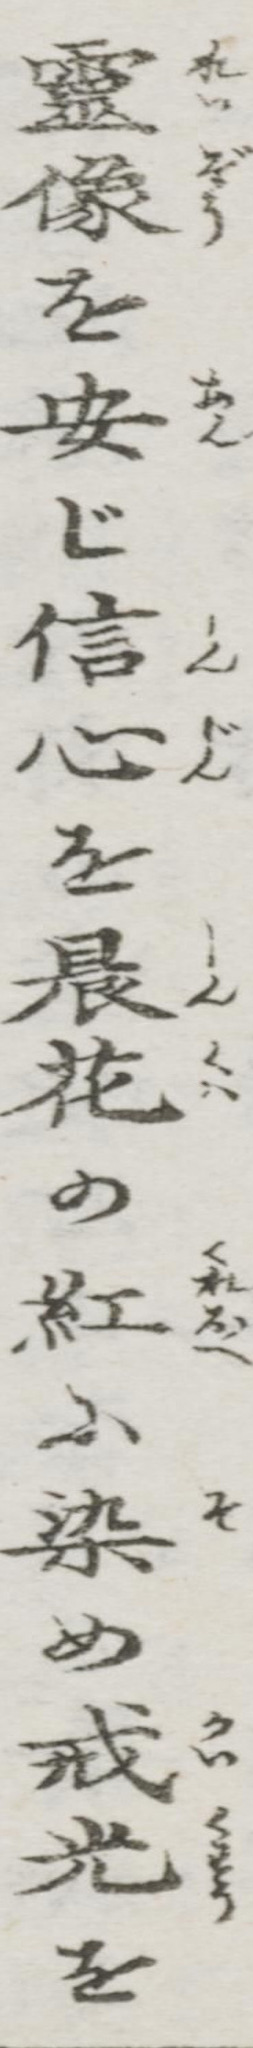霊像を安じ信心を晨花の紅に染め戒光を
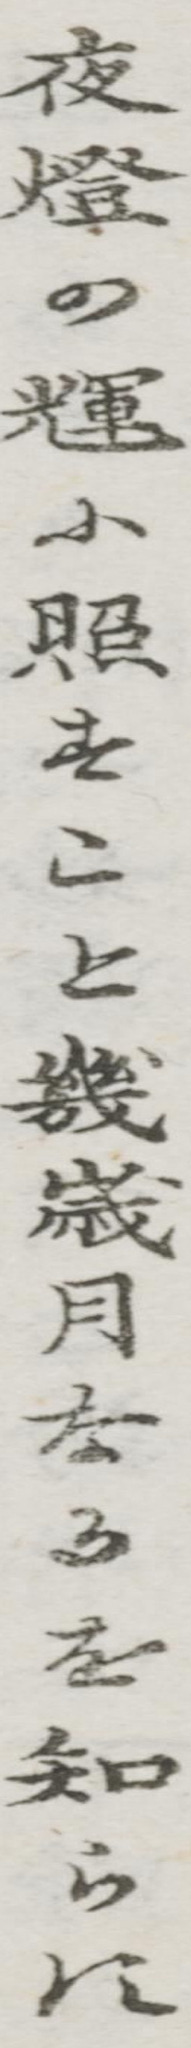夜燈の輝に照すこと幾歳月なるを知らす
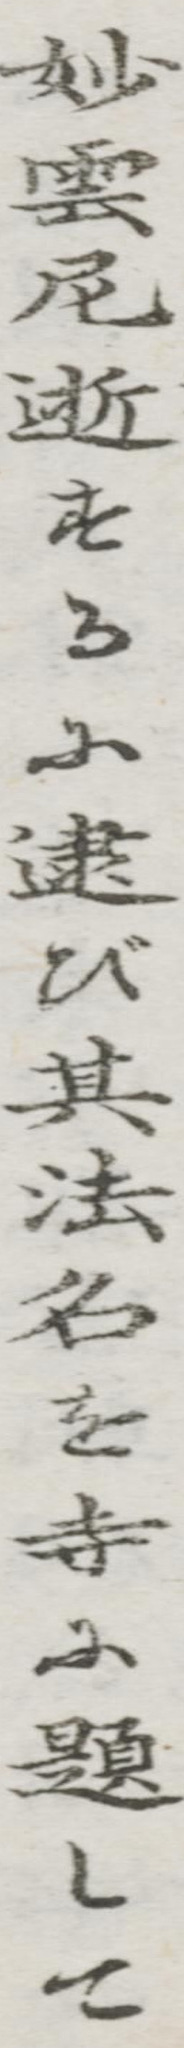妙雲尼逝するに逮び其法名を寺に題して
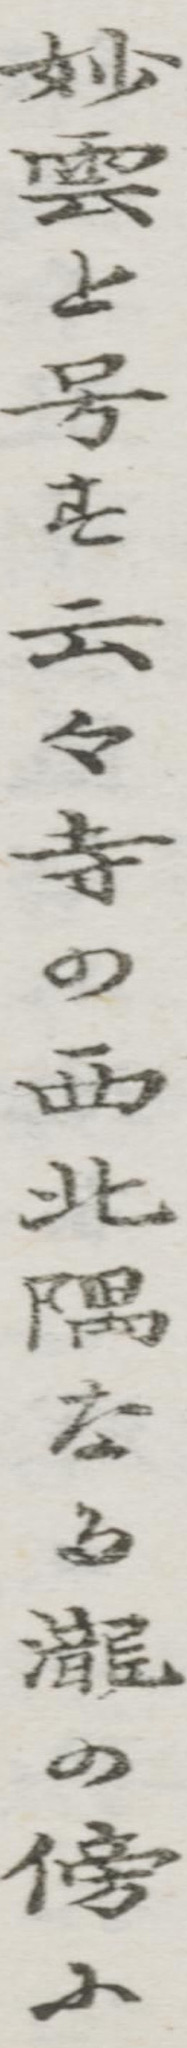妙雲と号す云々寺の西北隅なる瀧の傍に
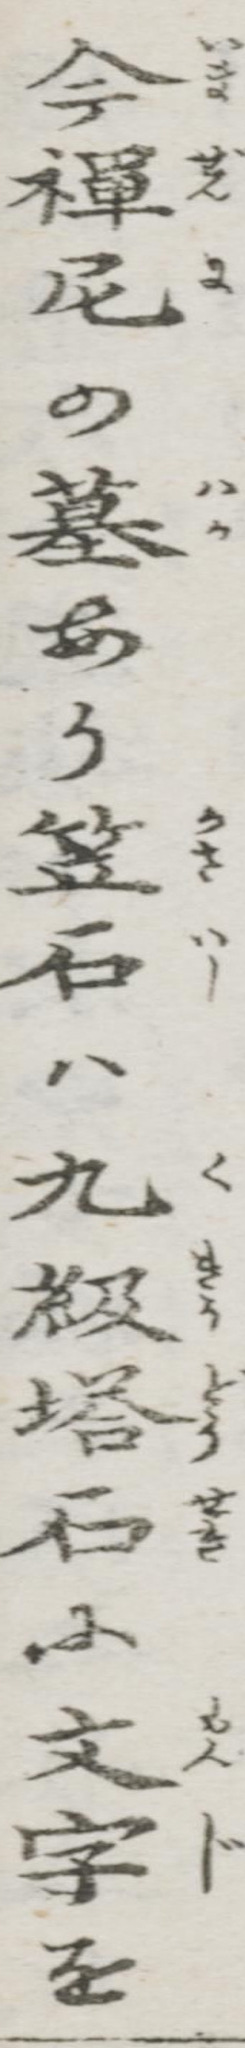今禅尼の墓あり笠石は九級塔石に文字を
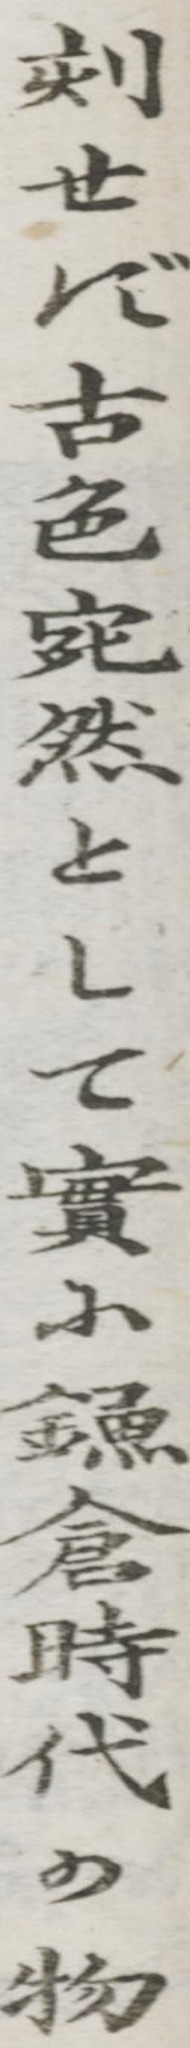刻せず古色宛然として實に鎌倉時代の物
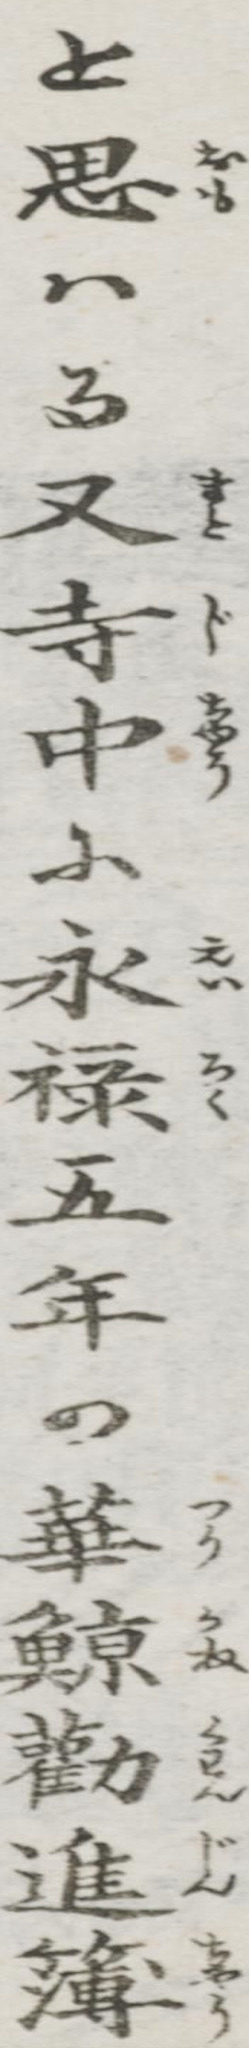と思はる又寺中に永禄五年の華鯨勧進簿
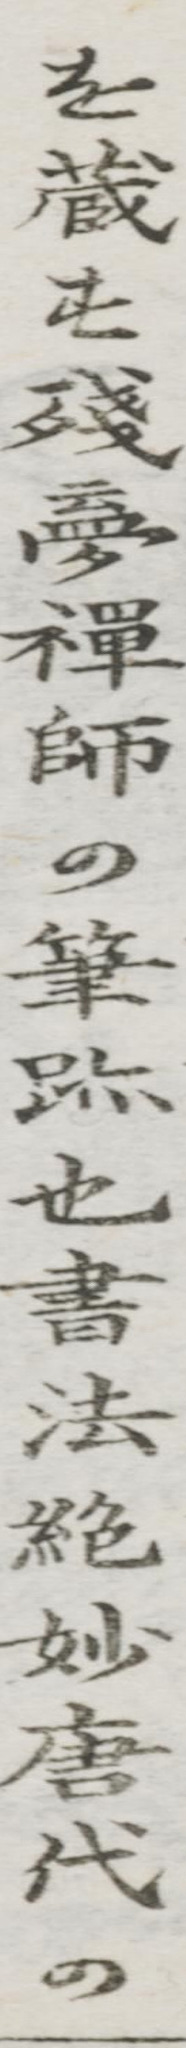を蔵す殘夢禅師の筆跡也書法絶妙唐代の
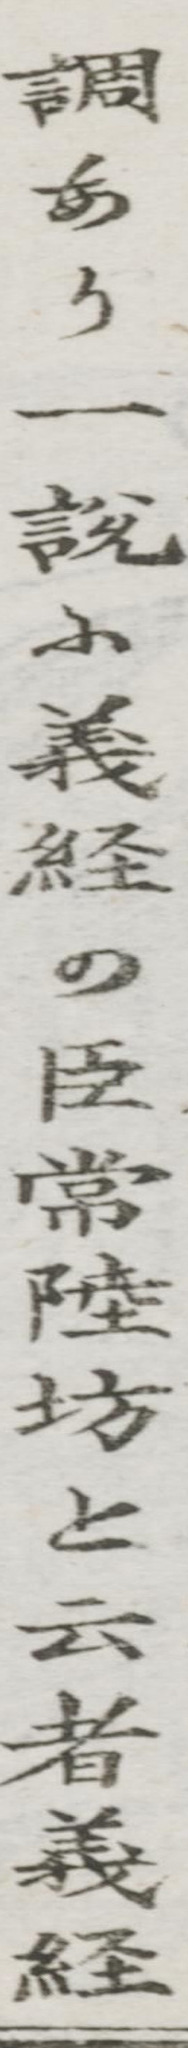調あり一説に義経の臣常陸坊と云者義経
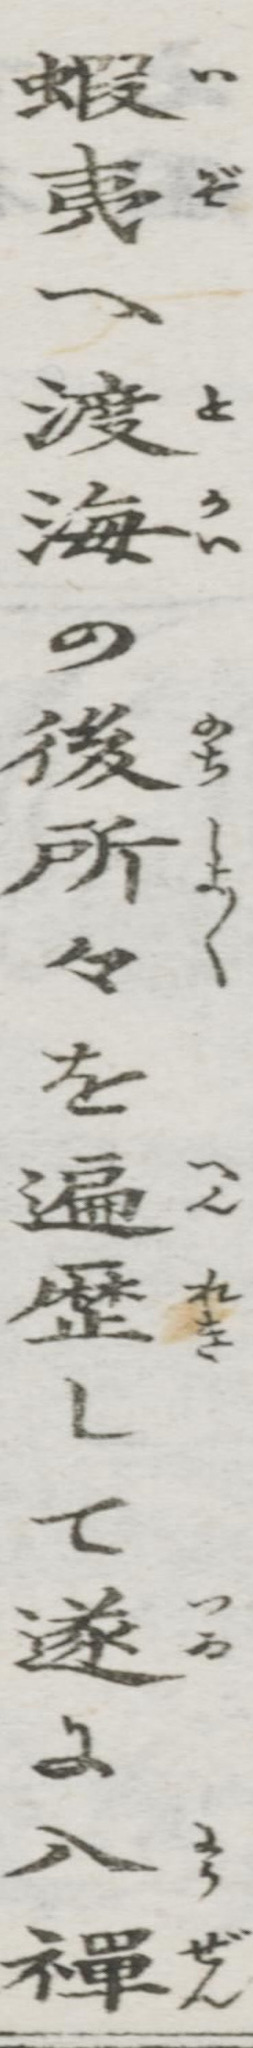蝦夷へ渡海の後所々を遍歴して遂に入禅
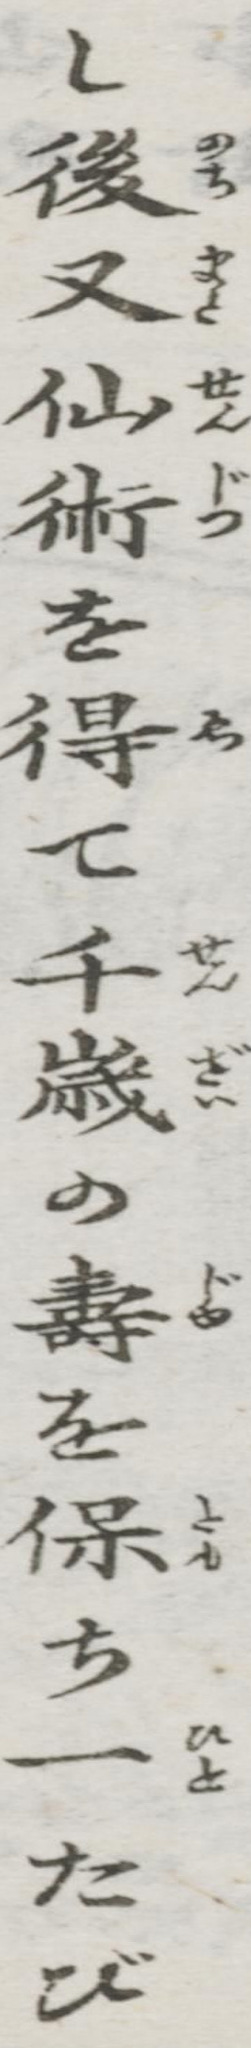し後又仙術を得て千歳の壽を保ち一たび
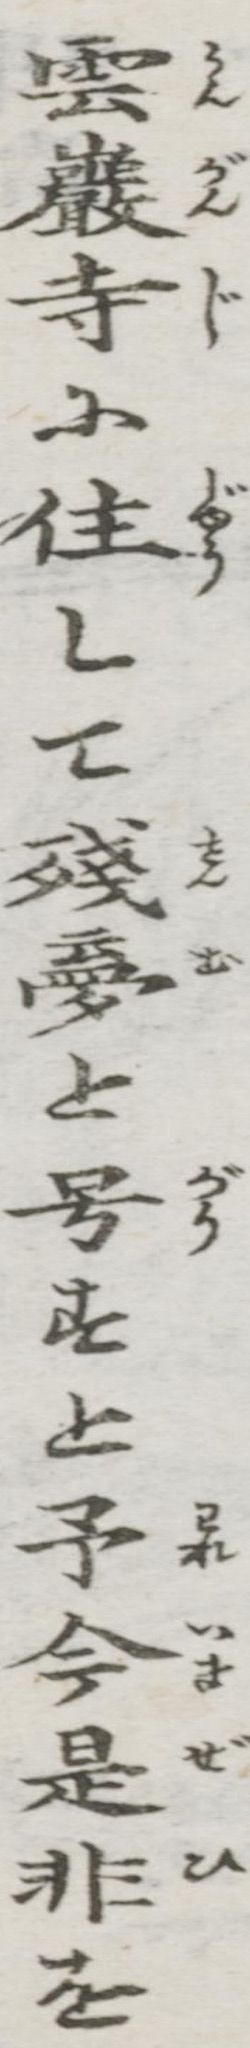雲巌寺に住して殘夢と号すと予今是非を
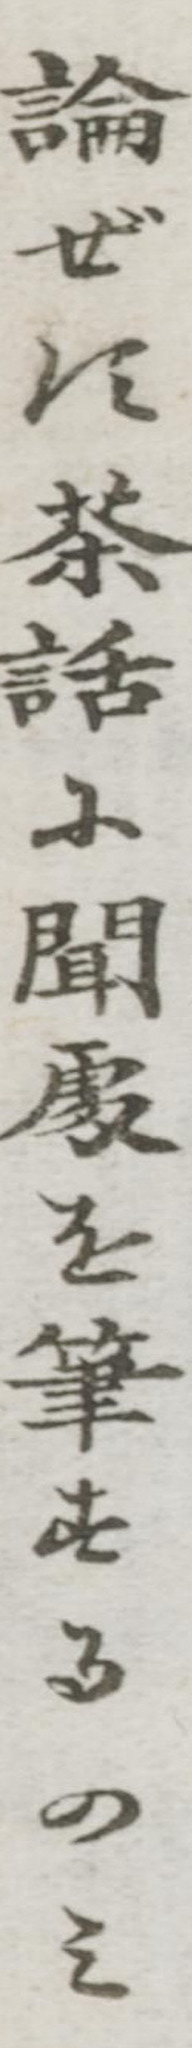論ぜす茶話に聞處を筆するのみ

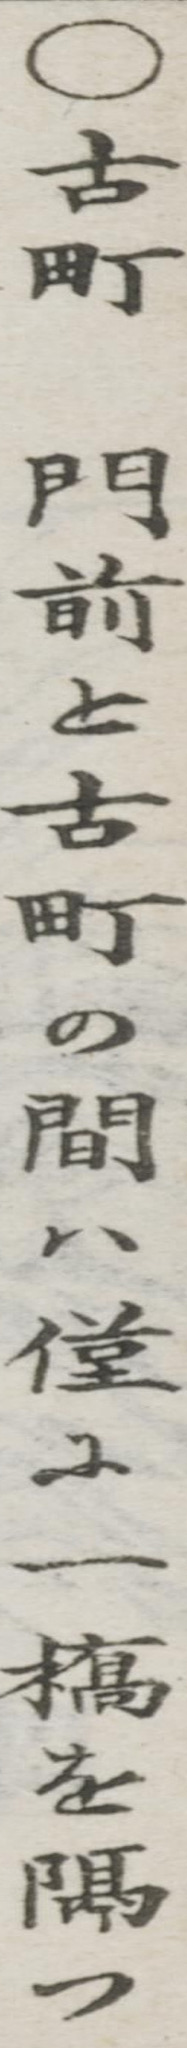○古町門前と古町の間は僅に一橋を隔つ
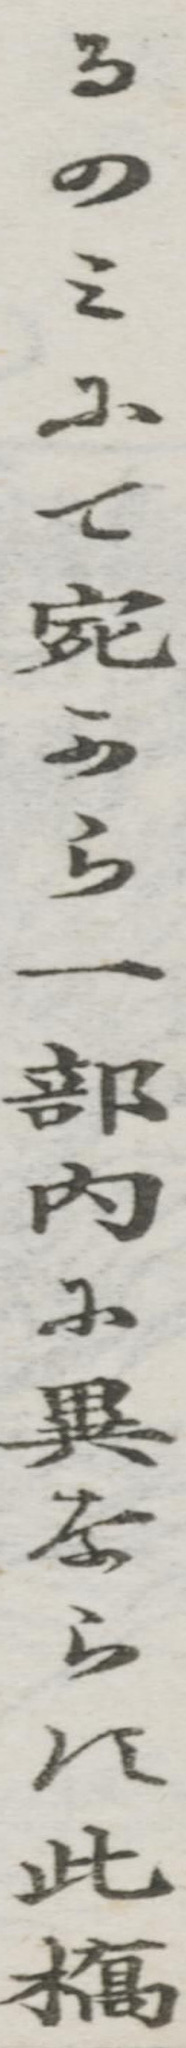るのみにて宛から一部内に異ならす此橋
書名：塩原繁昌記　全
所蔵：東京大学地震研究所図書室 Earthquake Research Institute Library, The University of Tokyo, JAPAN
